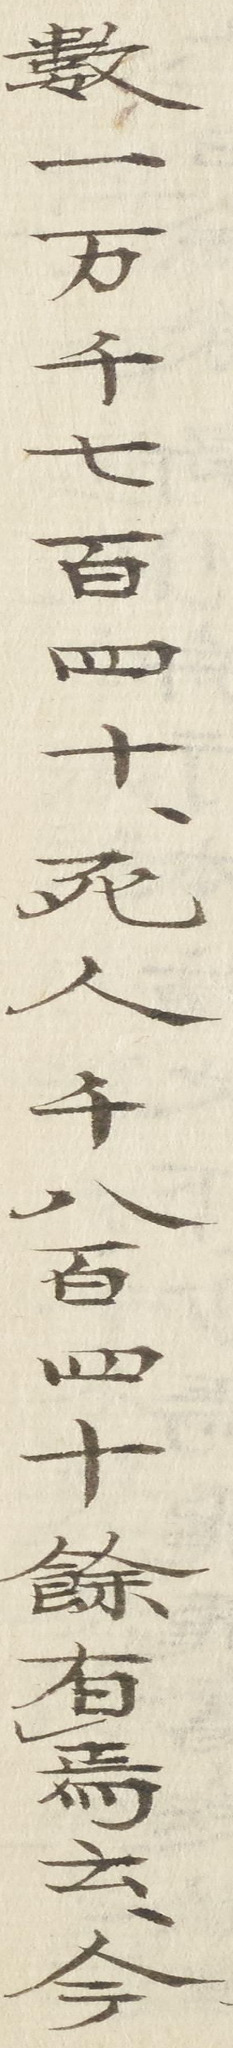数一万千七百四十、死人千八百四十餘有焉云、今
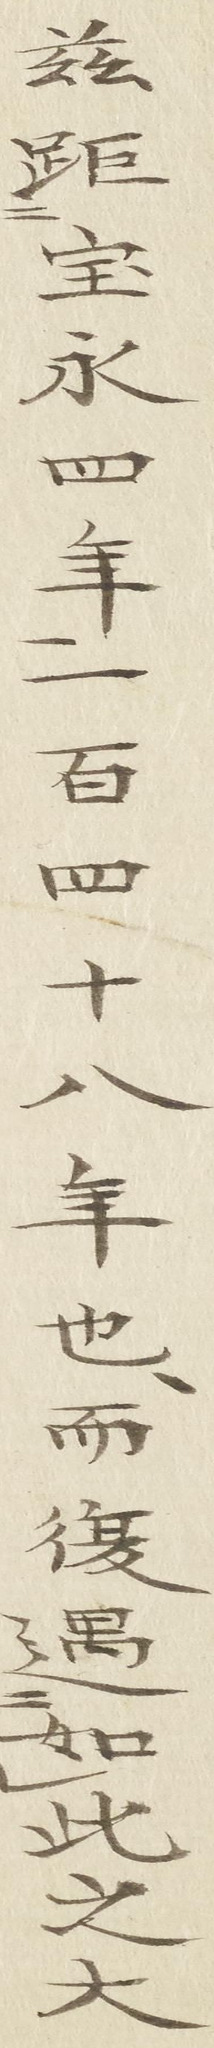茲距宝永四年一百四十八年也、而復遇如此之大

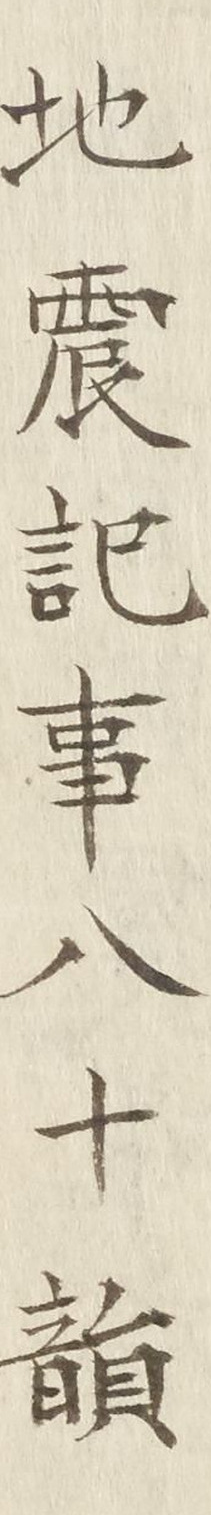地震記事八十韻
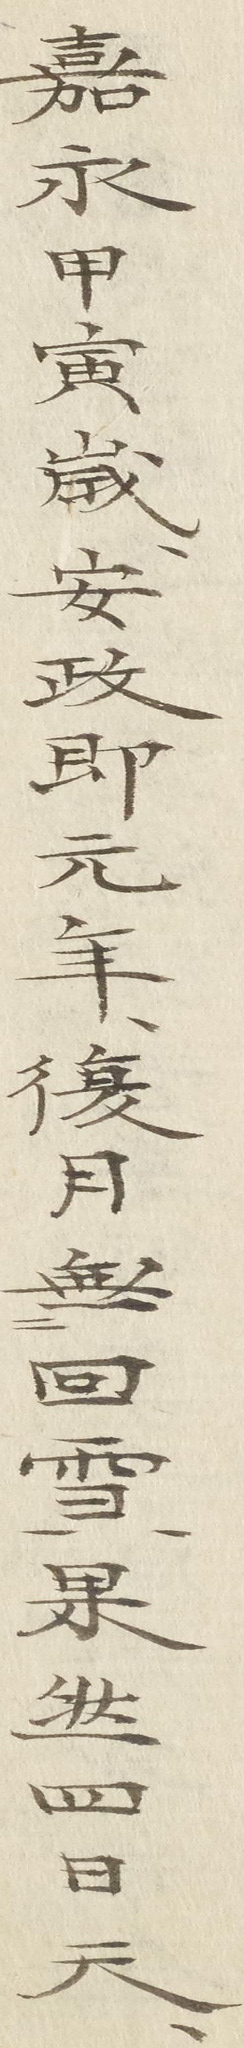嘉永甲寅歳安政即元年、復月無回雪、果然四日天、
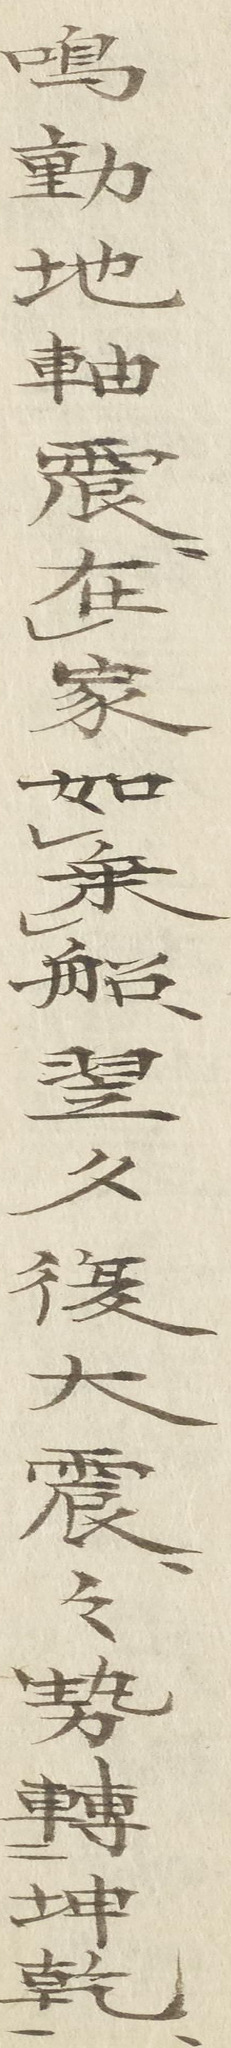鳴動地軸震、在家如乗船、翌夕復大震、今勢転乾坤、
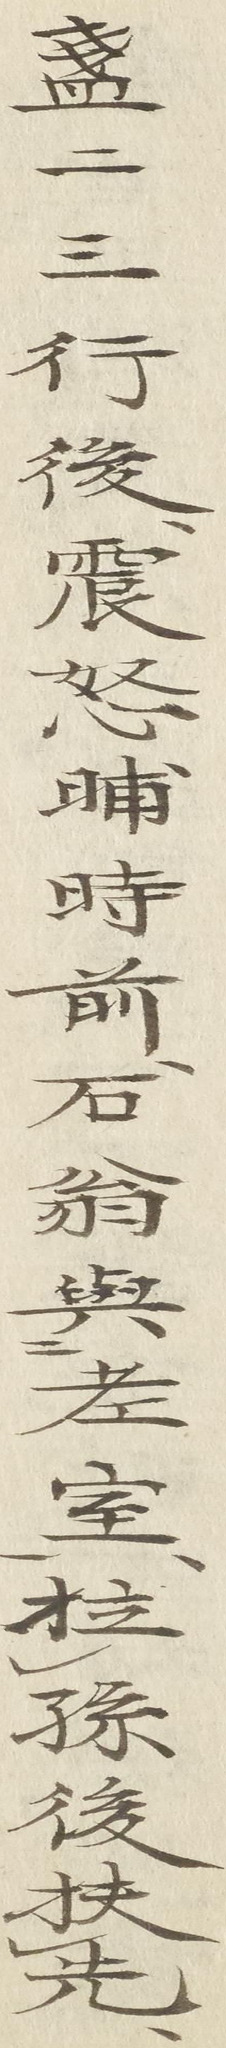盞二三行後、震怒晡時前、石翁與老室、柆孫後扶先、
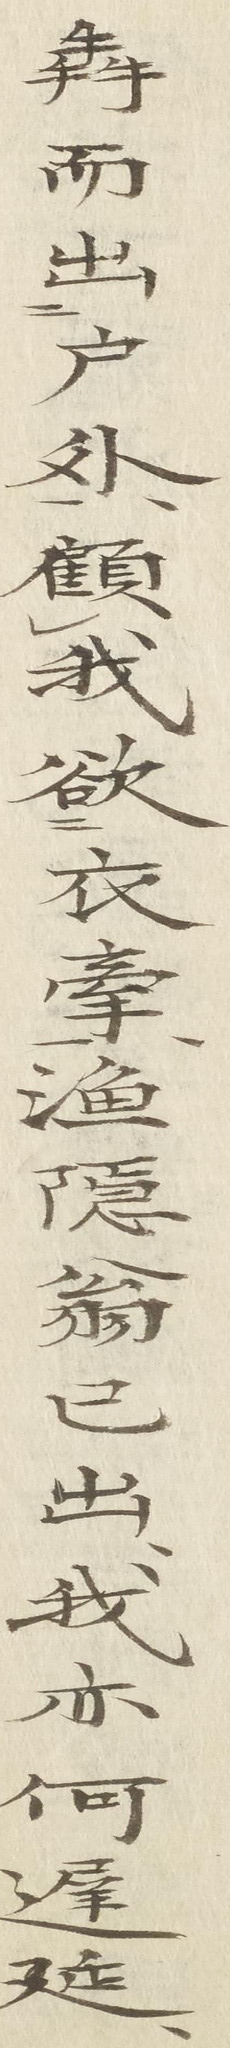犇而出戸外、顧我欲衣牽、漁隠翁已出、亦何遅延、
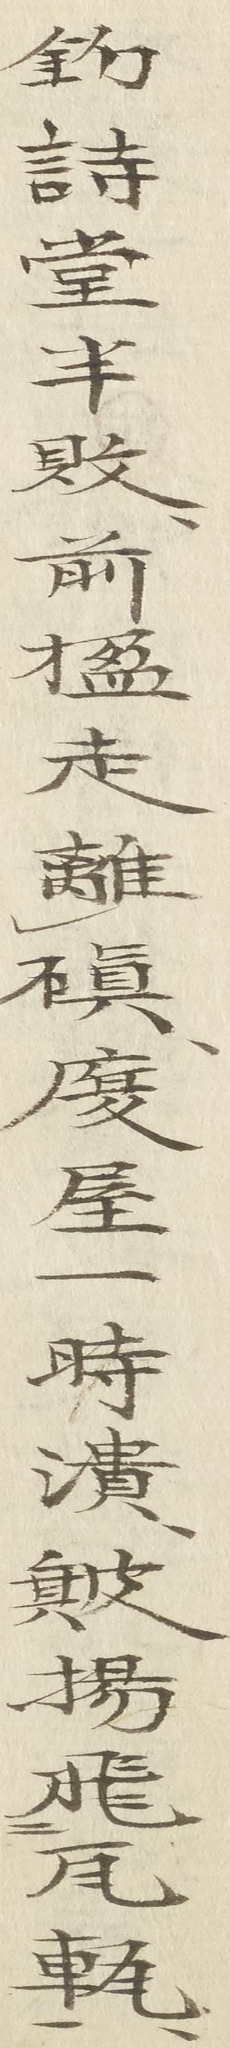釣詩堂半敗、前楹走離槙、慶屋一時潰欺揚飛瓦軋
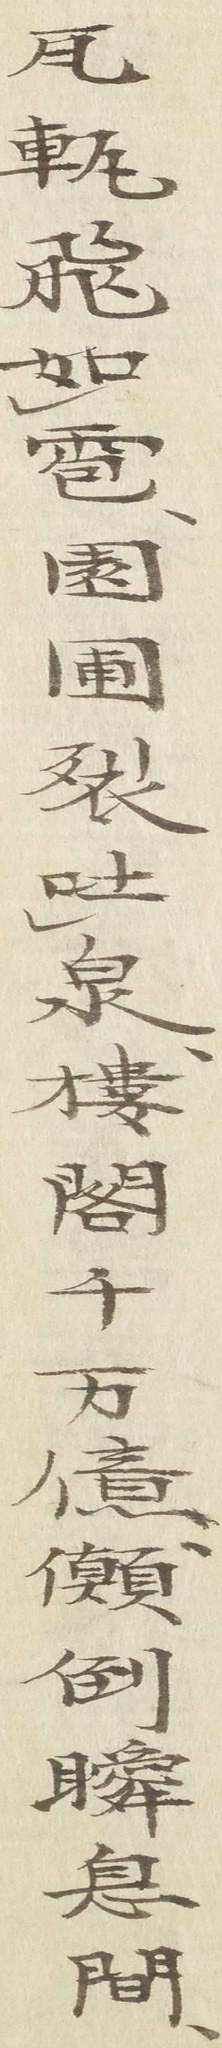瓦軋飛如雹、園圃裂吐泉、楼閣千万億顛倒瞬息間、

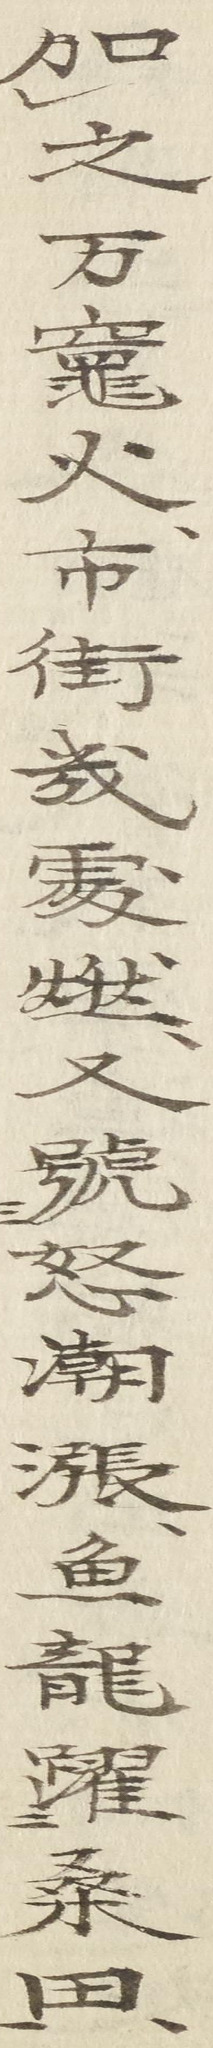加之万竈火市街幾処燃、又號怒潮漲、魚龍躍桑田
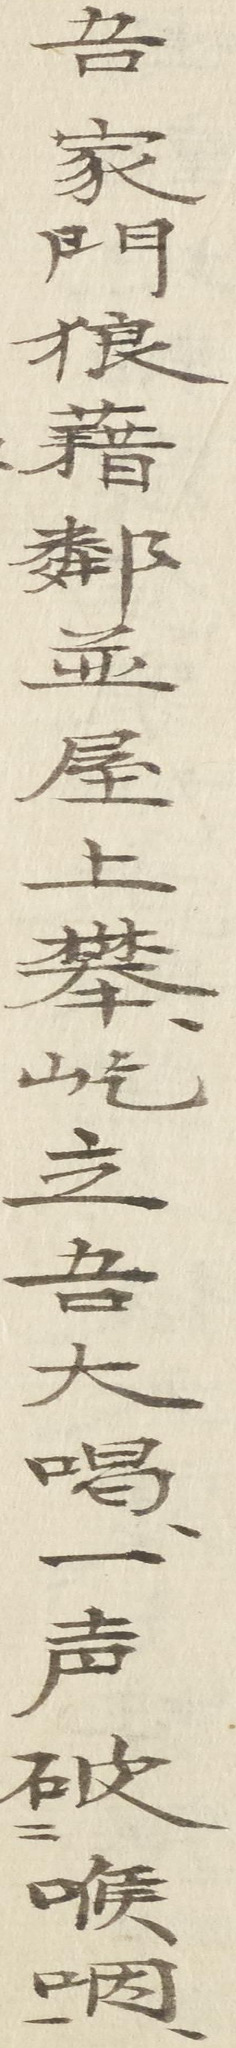吾家門狼藉鄰並屋上攀、屹立大喝一声破喉咽、
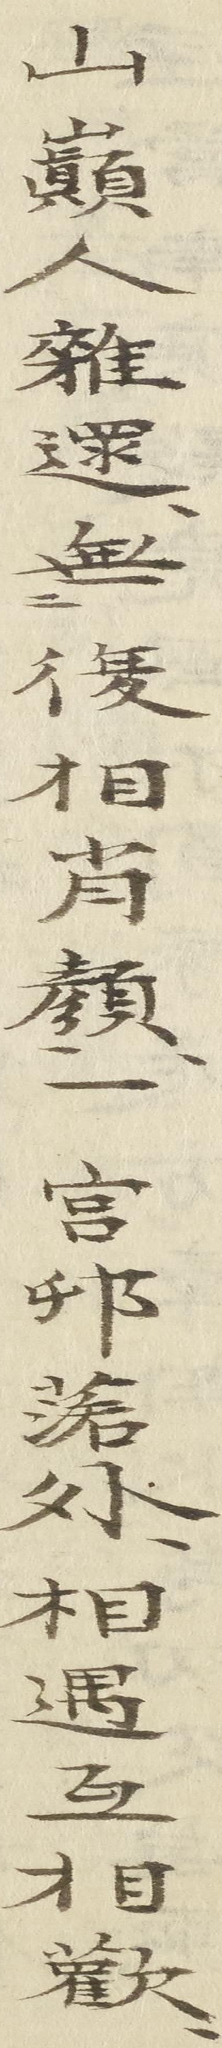山巓人雑還、無復相背顔、一宮邸落外、相遭互相歓、
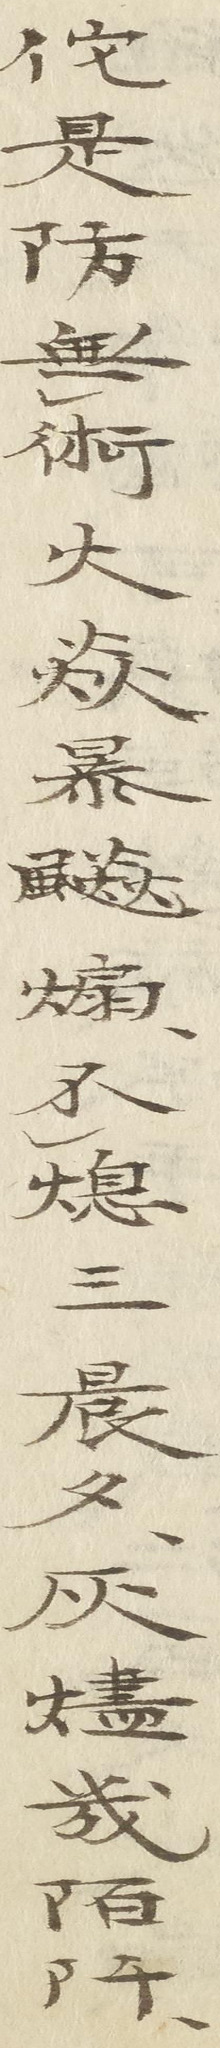侘是防無術火焱暴飈煽不熄三晨タ、灰燼幾陌阡、
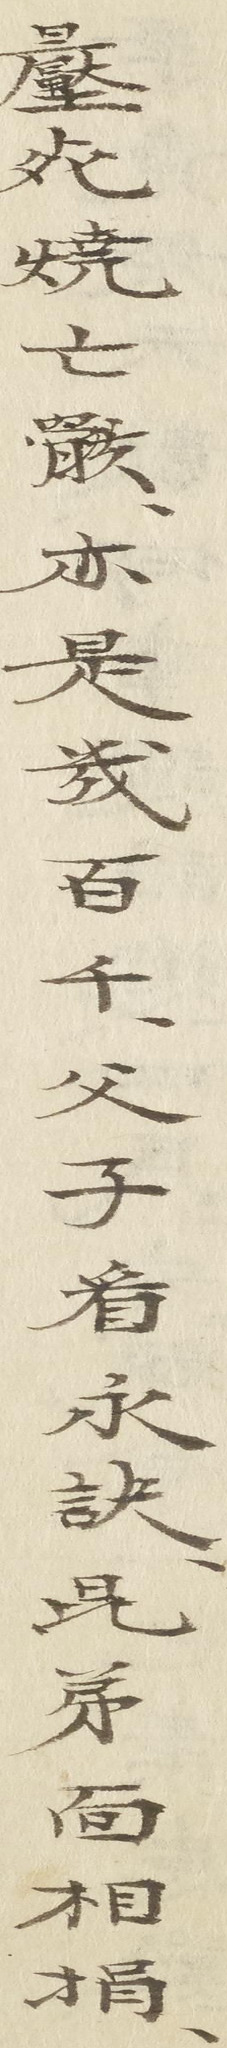壓死焼亡骸、又是幾百幾千父子看永訣、昆弟面相損、
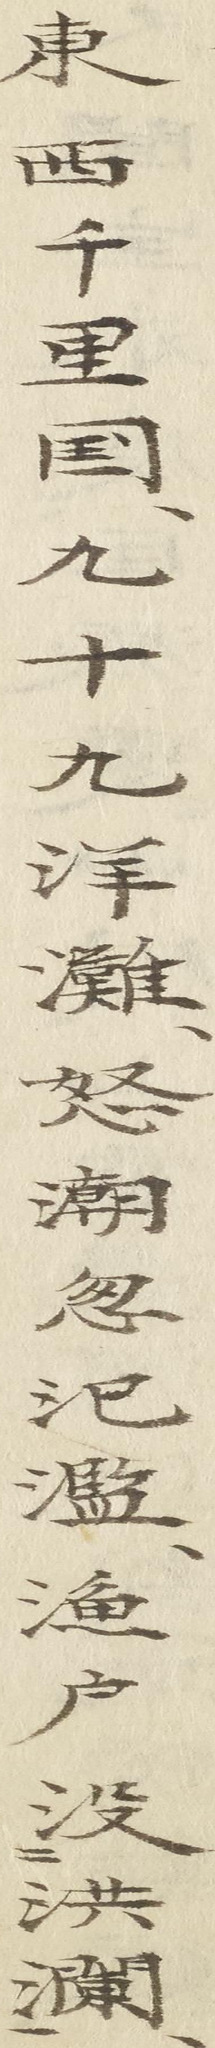東西千里国、九十九洋灘、怒潮忽氾濫、漁戸没洪瀾、
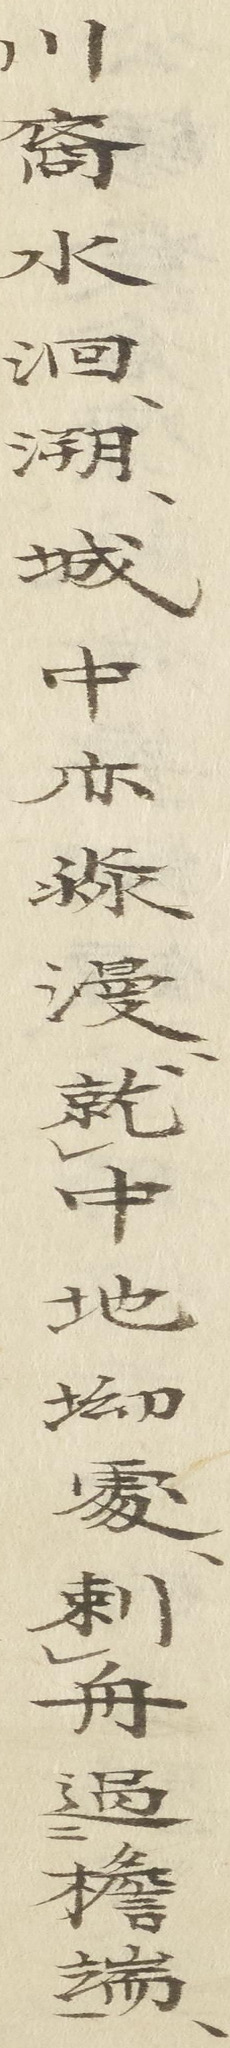川裔水洄湖城中亦淼漫、就中地坳処、刺舟過擔端、
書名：地震記　下
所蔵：東京大学地震研究所図書室 Earthquake Research Institute Library, The University of Tokyo, JAPAN
